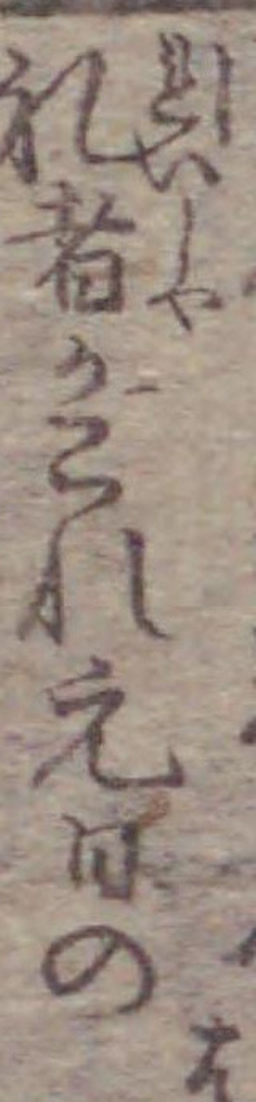礼者かこれ元日の
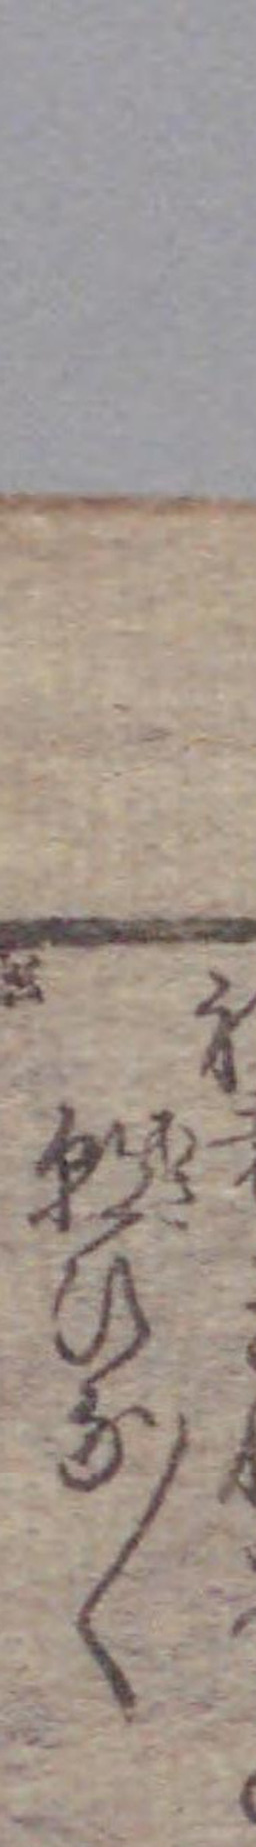朝ひな〳〵
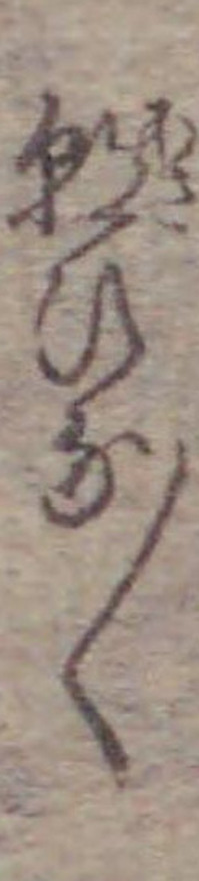朝ひな〳〵

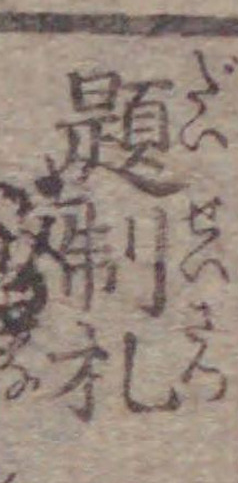題制札
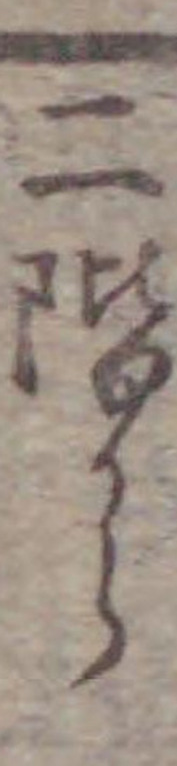二階から
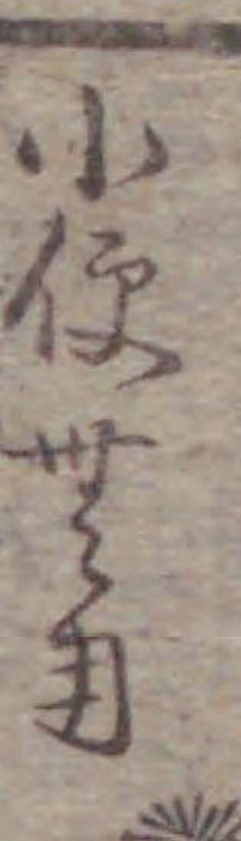小便無用
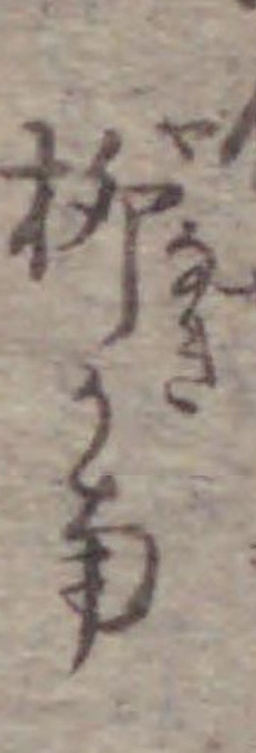柳かな
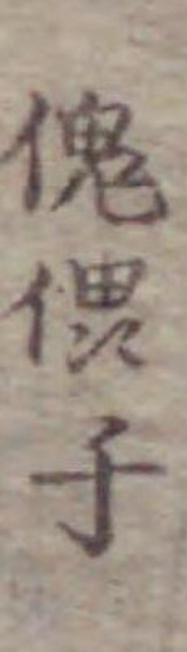傀儡子
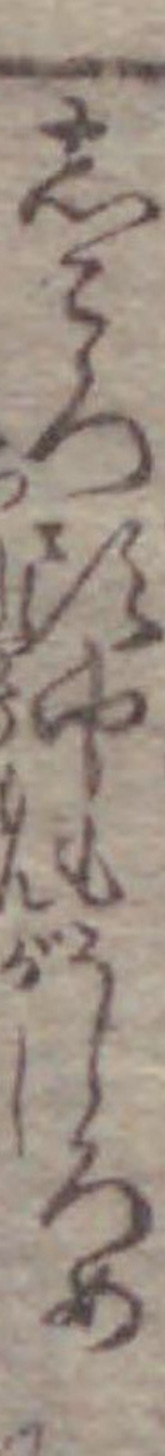しころ頭巾もうしろめ
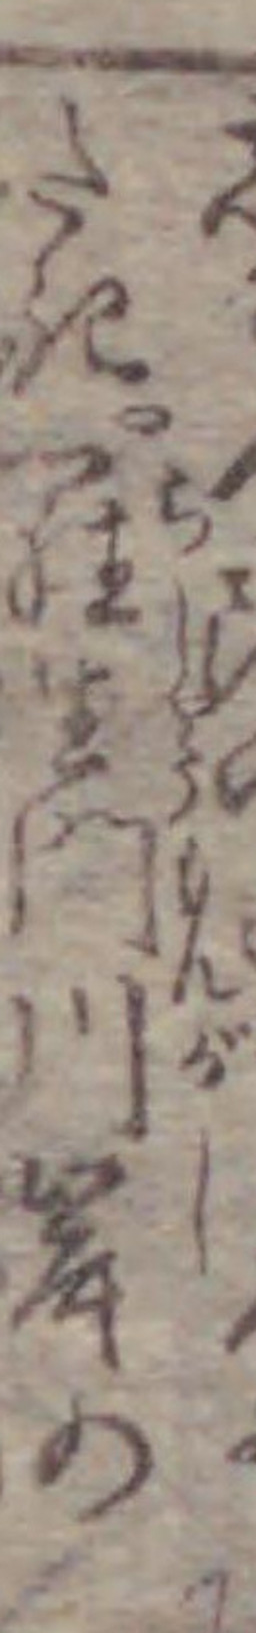たき。羅生門河岸の
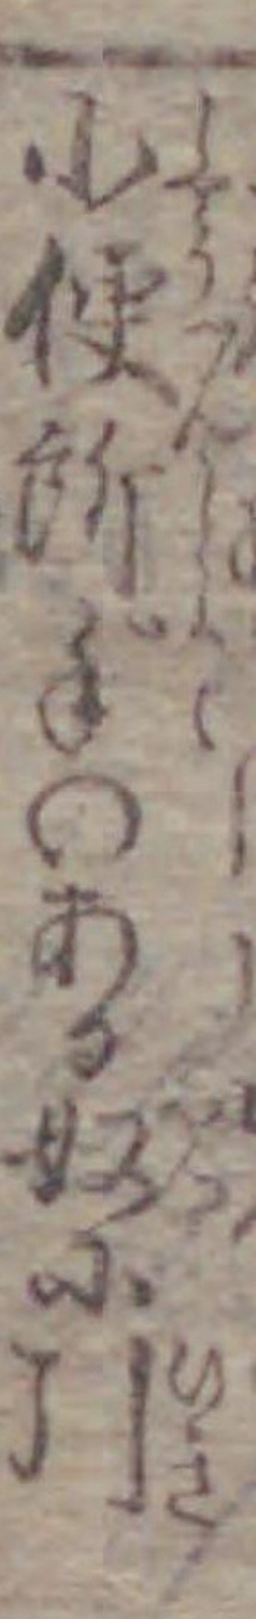小便所。手のある奴に引
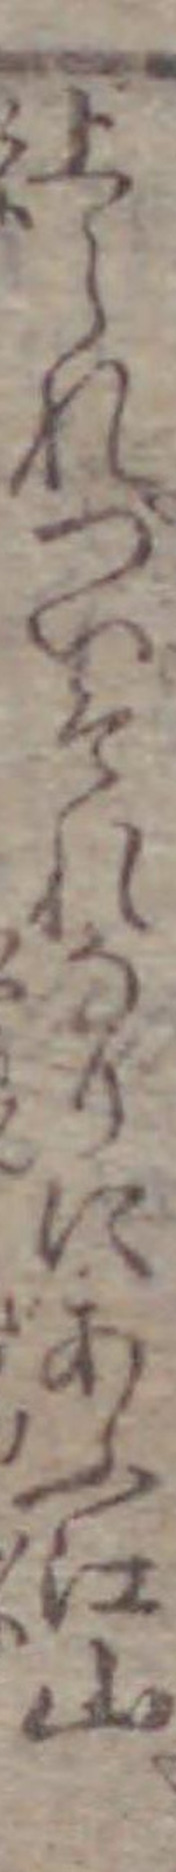上られ。ついそれなりにあふ江山。
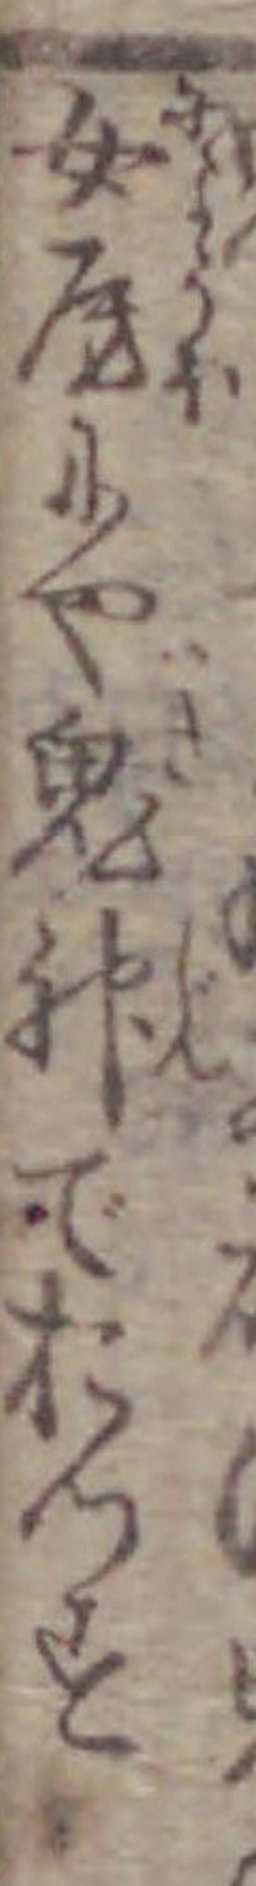女房にや鬼神でおつす
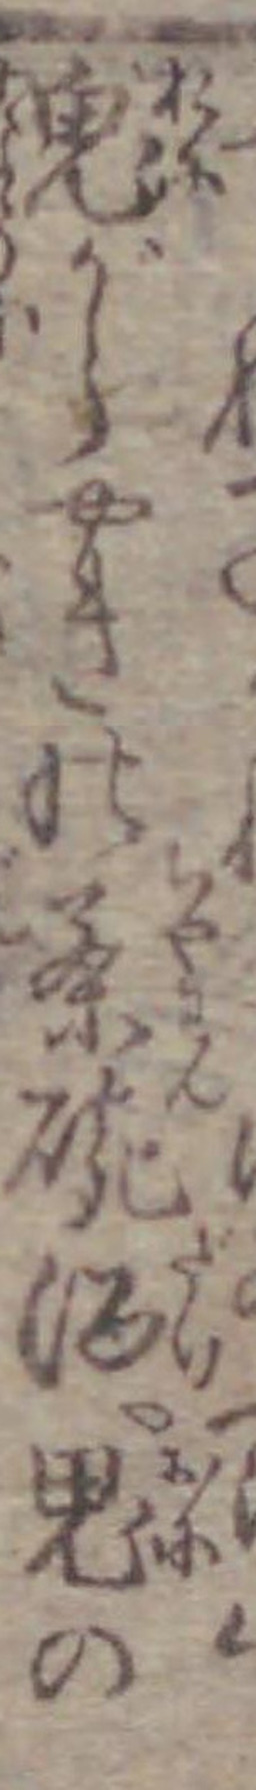鬼がしらやきの茶碗酒。鬼の
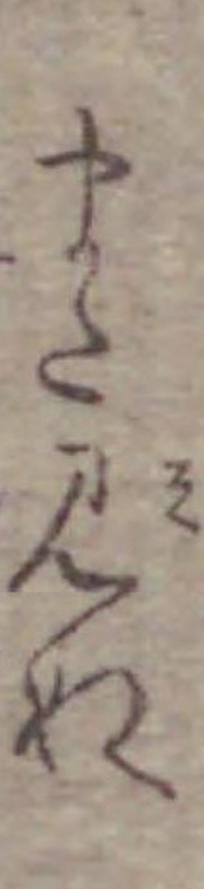まだ見ぬ
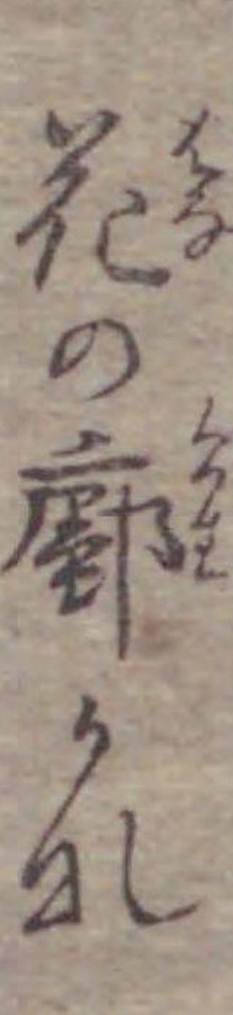花の廓かな
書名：武者合天狗俳諧 : 2巻
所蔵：国立国会図書館 National Diet Library, JAPAN
